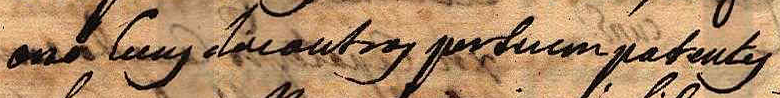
avaõ huns dos outros por serem parentes
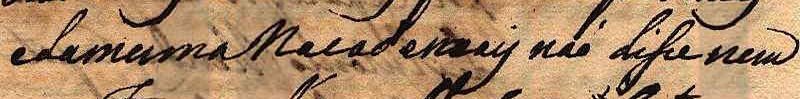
e da mesma Naçaõ e mais naõ disse nem
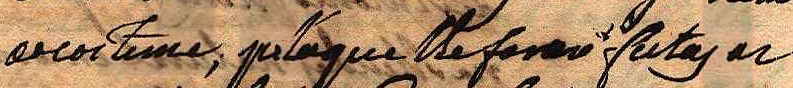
ao costume; pelo que lhe foraõ feitas as
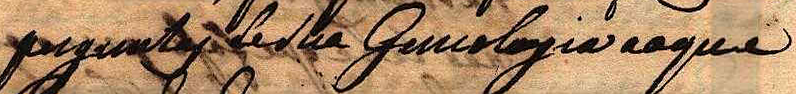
perguntas de sua Geneologia ao que
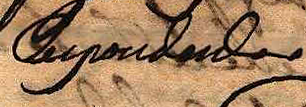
Respondendo.
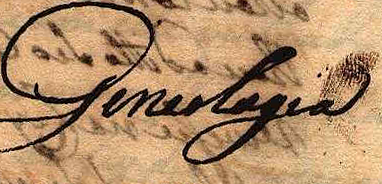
Genealogia
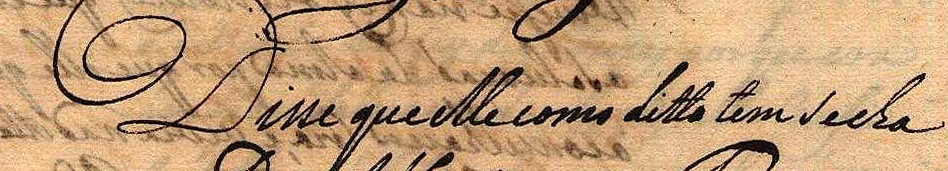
Disse que elle como ditto tem se cha
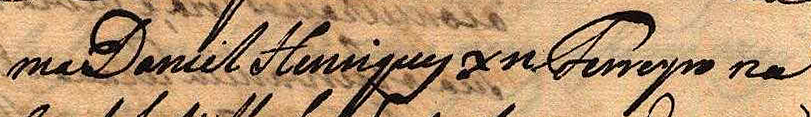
ma Daniel Henriques xn Ferreyro na
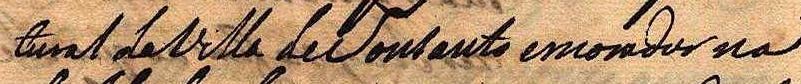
tural da Villa de Sousanto e morador na
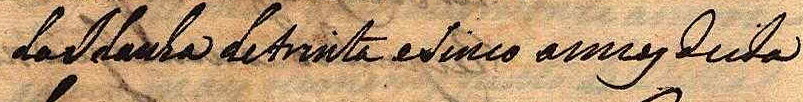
da Idanha de trinta e sinco annos de ida
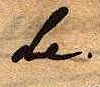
de.
